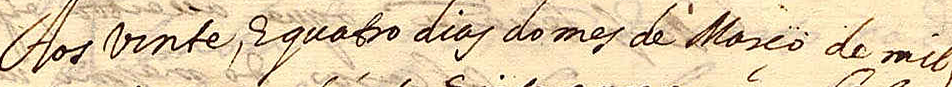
Aos vinte, E quatro dias do mes de Março de mil,
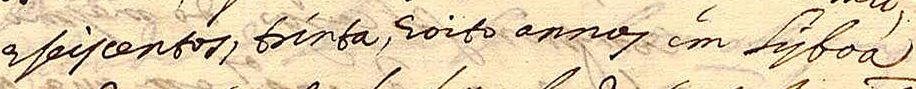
E seiscentos, trinta, E oito annos em Lisboa
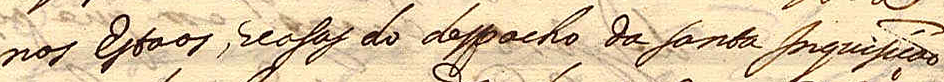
nos Estaos, E casas do despacho da Santa Jnquisição
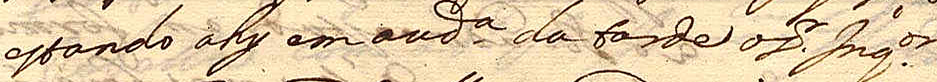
estando ahy em auda. da tarde o s.r Jnq.or
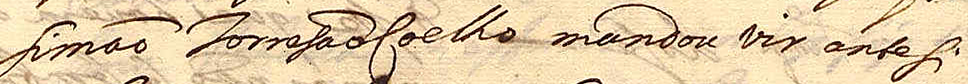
Simão Torresão Coelho mandou vir ante si
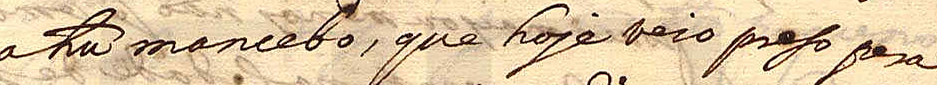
a h̄u mancebo, que hoje veio preso pera
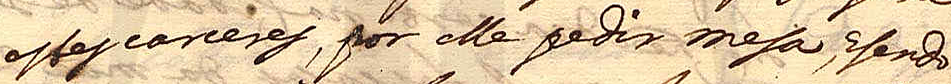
estes carceres, por elle pedir mesa, E sendo
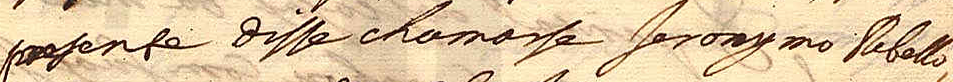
presente disse chamarse Jeronymo Rebello
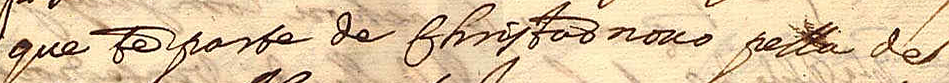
que t̄e parte de Christão nouo pella de
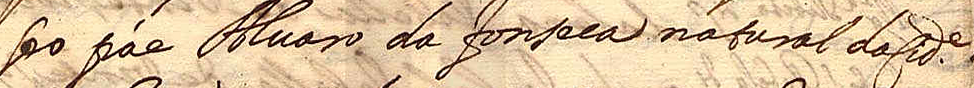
seo páe Aluaro da fonseca natural da Cid.e
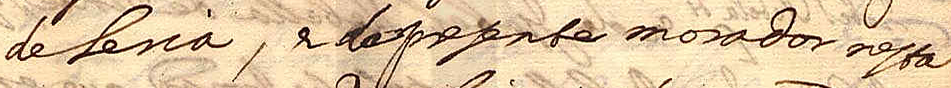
de Leria, E de presente morador nesta
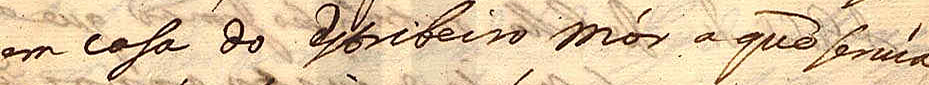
em casa do Estribeiro mór a qūe seruia
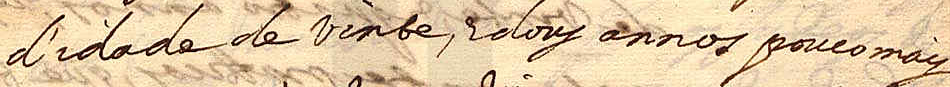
d'idade de vinte, E dous annos pouco mais
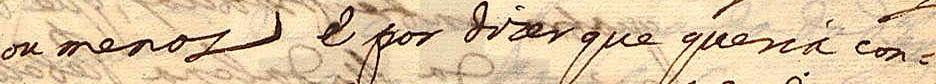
ou menos E por dizer que queria con
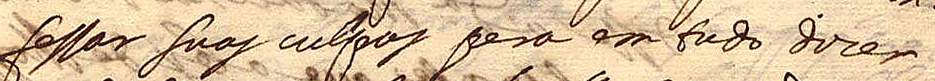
fessar suas culpas pera em tudo dizer
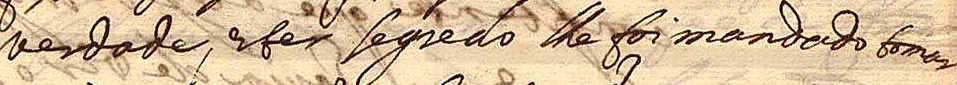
verdade, E ter segredo lhe foi mandado tomar
